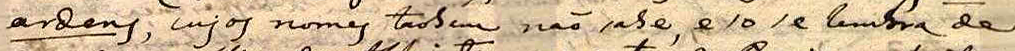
ordens, cujos nomes taobem naõ sabe, e só se lembra de
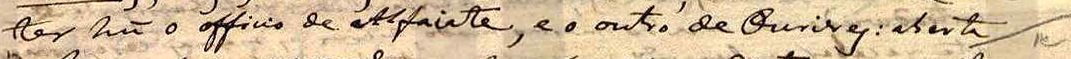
ter hū o officio de Alfaiate, e o outro de Ourives: aberta
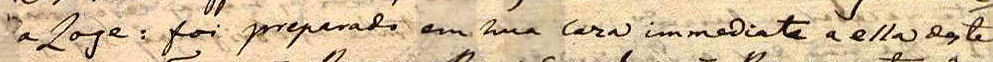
a Loge: foi preparado em hua caza immediata a ella deste
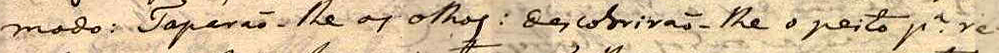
modo: Taparaõ-lhe os olhos: descobriraõ-lhe o peito p.a re
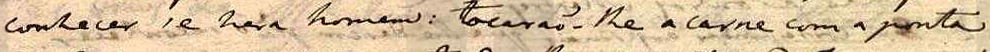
conhecer se hera homem: tocaraõ-lhe a carne com a ponta
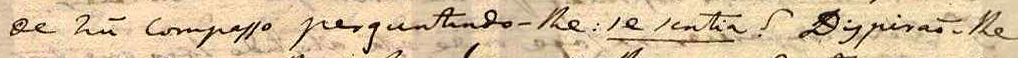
de hū compasso perguntado-lhe: se sentia? Dispiraõ-lhe
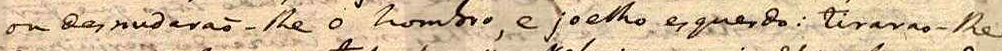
ou desnudaraõ-lhe o hombro, e joelho esquerdo: tirarao-lhe
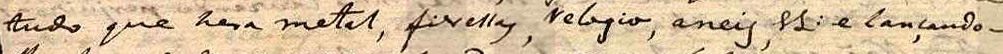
ttudo que hera metal, fivellas, relogio, aneis, &c e lançando
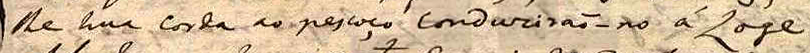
lhe huā corda ao pescoço conduziraõ-no á Loge.
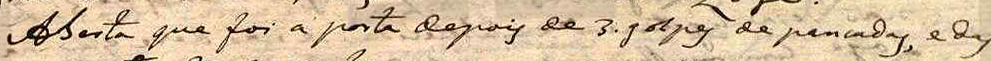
Aberta que foi a porta depois de 3. golpes de pancadas, e das
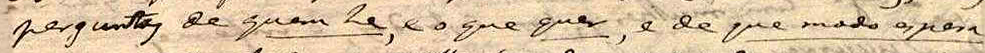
perguntas de quem he, e o que quer, e de que modo espera
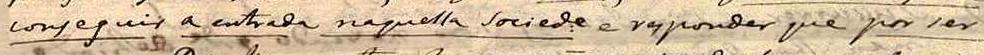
conseguir a entrada naquella socied.e e responder que por ser
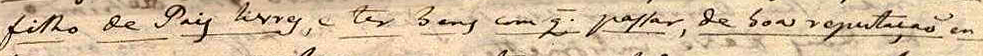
filho de Pais livres, e ter bens com q̄ passar, de boa reputaçaõ en
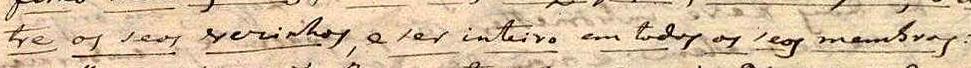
tre os seos vezinhos, e ser inteiro em todos os seos membros:
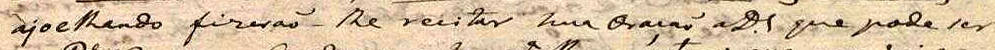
ajoelhando fizeraõ-lhe recitar hua oraçaõ a D.s que pode ser
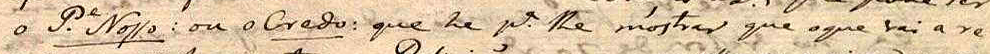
o P.e Nosso: ou o Credo: que he p.a lhe mostrar que o que vai a re
